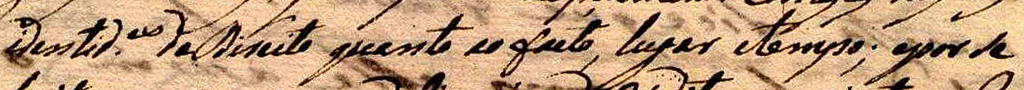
identid.es do Direito quanto ao facto, lugar e tempo; e por se
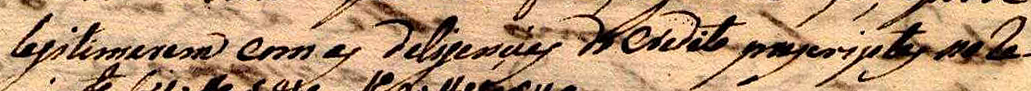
legitimarem com as deligençias do credito prescriptas no Re
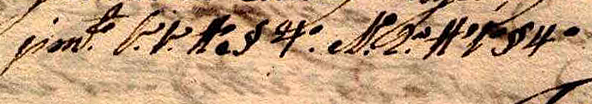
gim.to l.o 1.o tte § 4.o N.o 2.o tt.o 1o § 4o
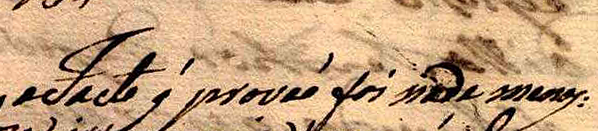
o Facto q̄ provaõ foi nada menos:
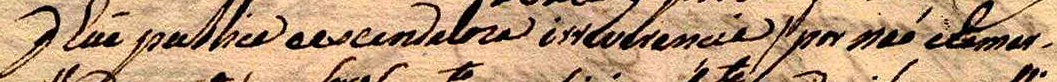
q̄ huā publica e excandaloza irreverencia/ por naõ chamar
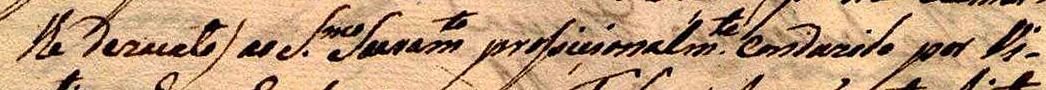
lhe dezacato / ao S.mo Sacram.to prossiçionalm.te conduzido por Vi
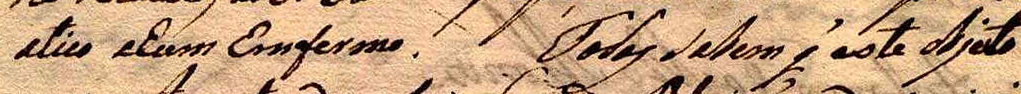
atico e hum Emfermo. Todos sabem q̄ este objeto
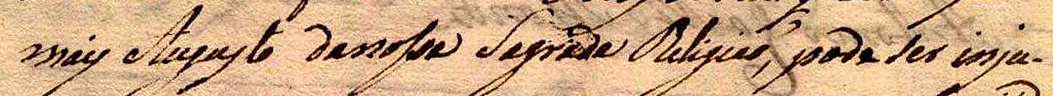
mais Augusto da nossa Sagrada Religiaõ, pode ser inju
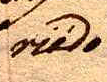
riádo
